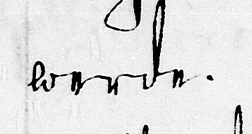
werde.
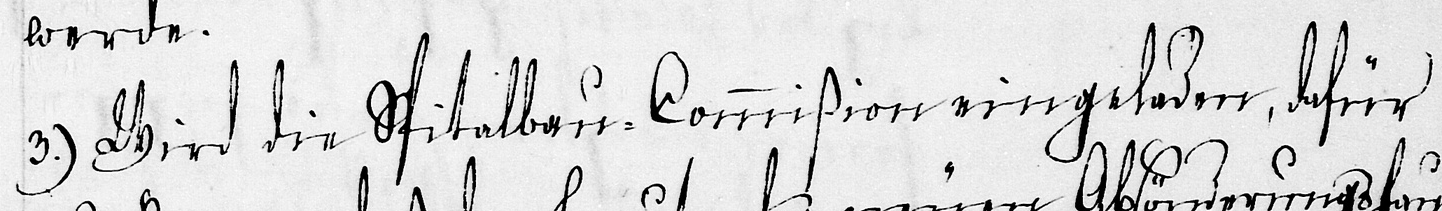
3.) Wird die Spitalbau-Commißion eingeladen, dafür
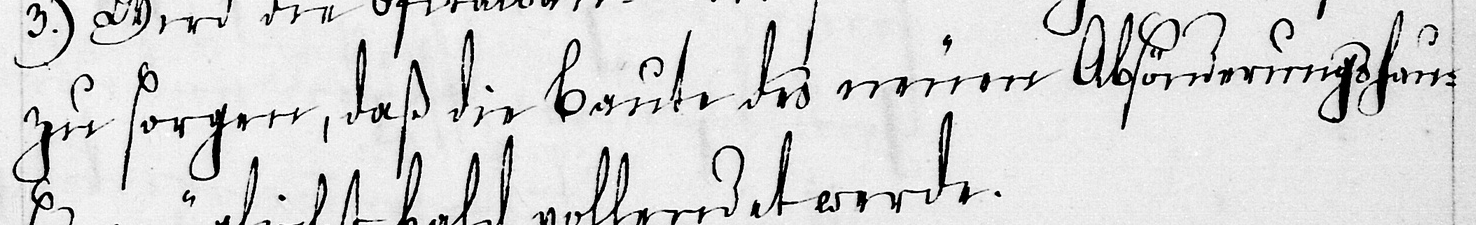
zu sorgen, daß die Baute des neuen Absönderungshau¬
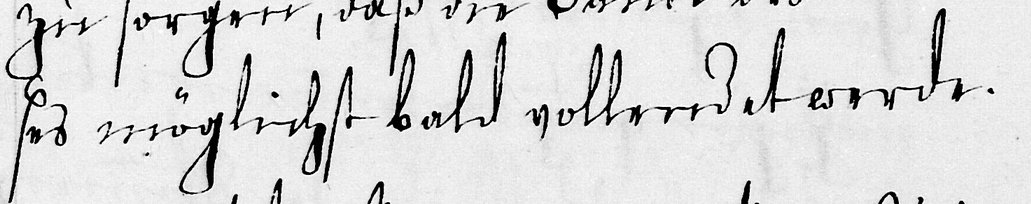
ses möglichst bald vollendet werde.
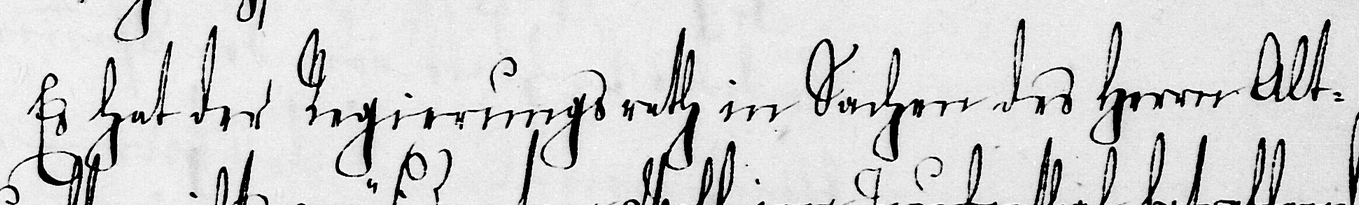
Es hat der Regierungsrath in Sachen des Herrn Al¬
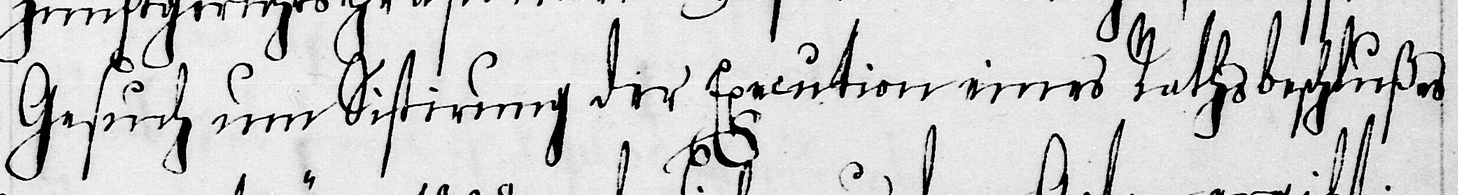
Gesuch um Sistirung der Execution eines Rathsbeschlußes
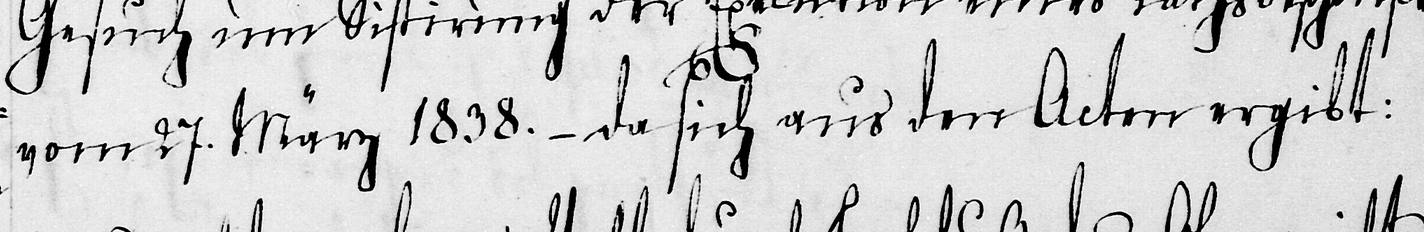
vom 27. März 1838. – da sich aus den Acten ergibt:
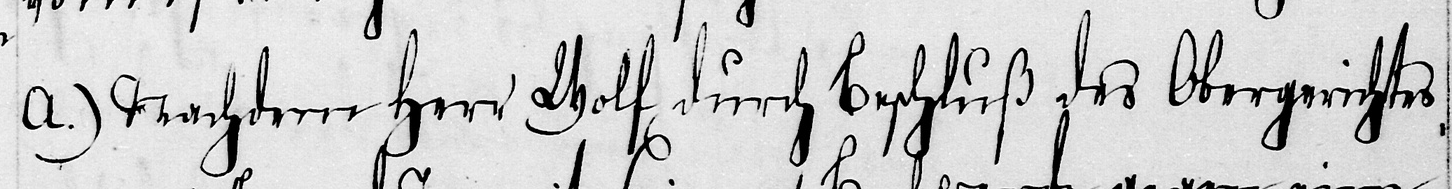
A.) Nachdem Herr Wolf durch Beschluß des Obergerichtes
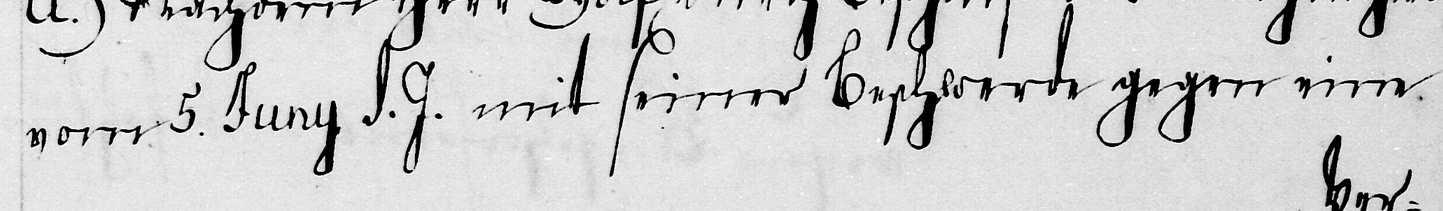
vom 5. Juny d. J. mit seiner Beschwerde gegen eine
